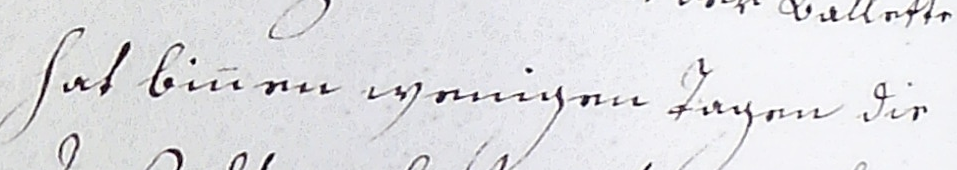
hat bin̅en wenigen Tagen die
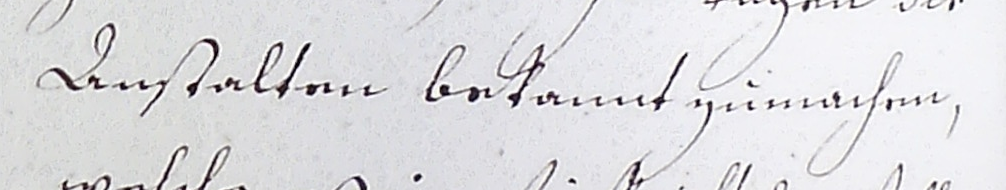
Anstalten bekannt zumachen,
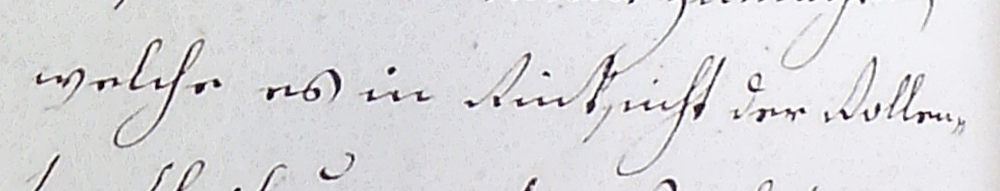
welche es in Rücksicht der Rollen¬
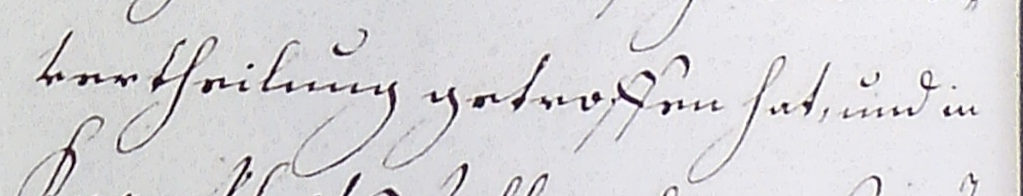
vertheilung getroffen hat, und in
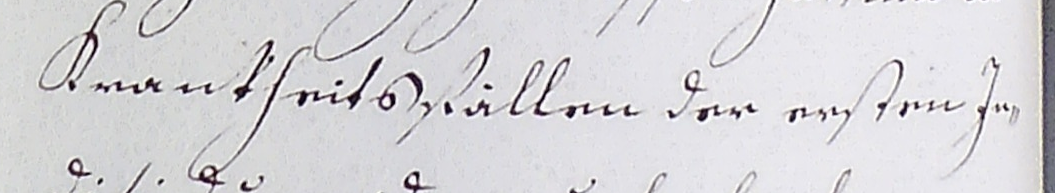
Krankheitsfällen der ersten In¬
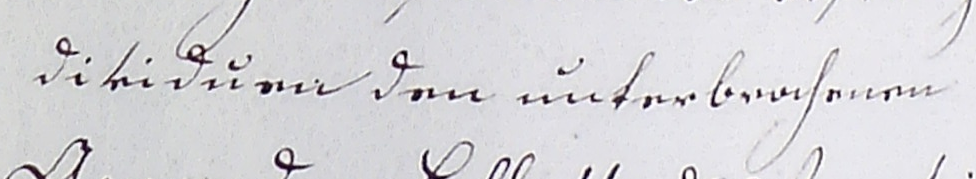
dividuen den unterbrochenen
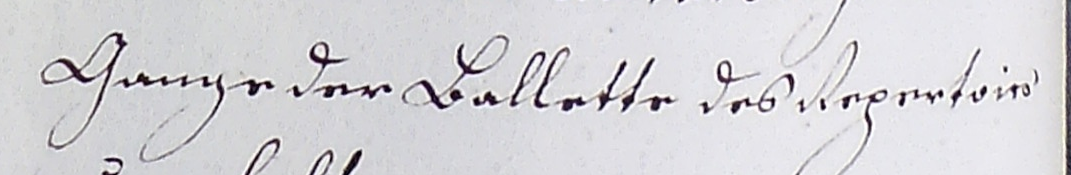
Gange der Ballette des Repertoirs
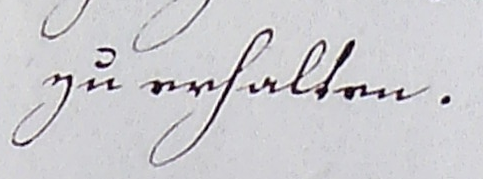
zu erhalten.
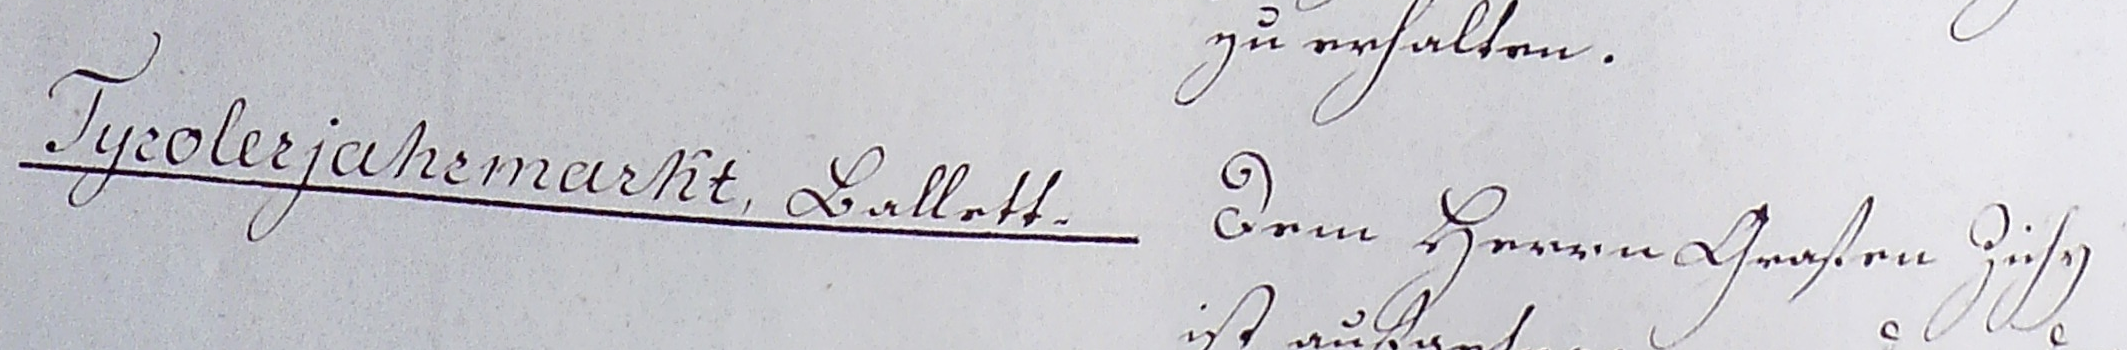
Tyrolerjahrmarkt, Ballett. Dem Herrn Grafen Zichy
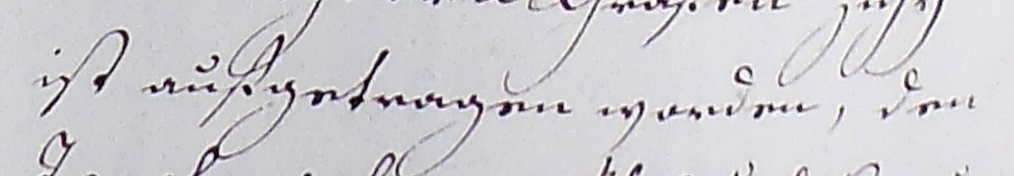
ist aufgetragen worden, den
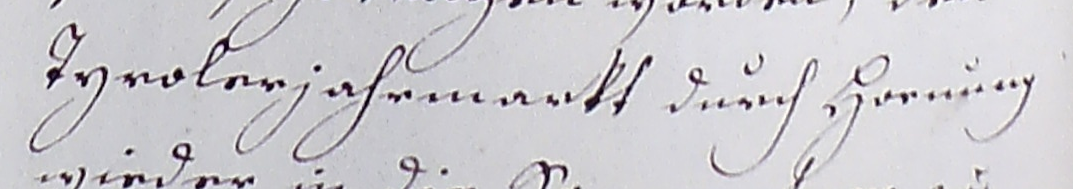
Tyrolerjahrmarkt durch Hornung
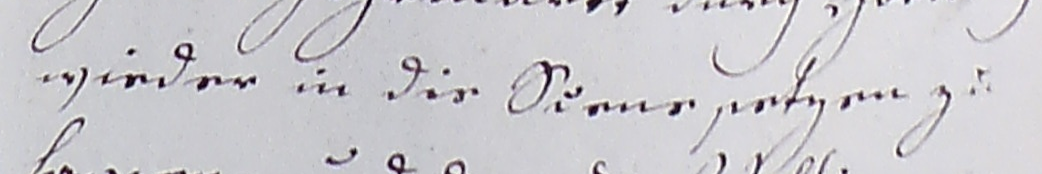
wieder in die Scene setzen zu
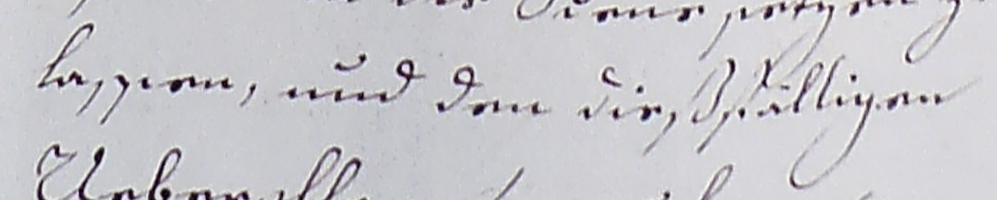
lassen, und den dießfälligen
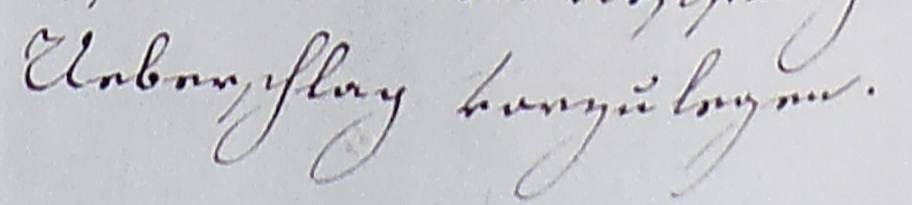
Ueberschlag vorzulegen.
